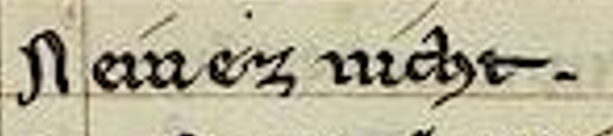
Nein ez nicht.
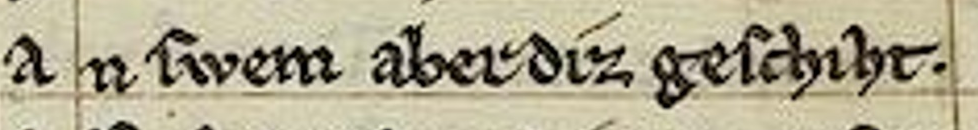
An ſwen aber diz geſchiht.
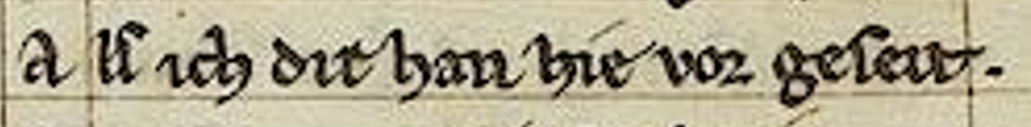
Alſ ich dir han hie vor geſeit.
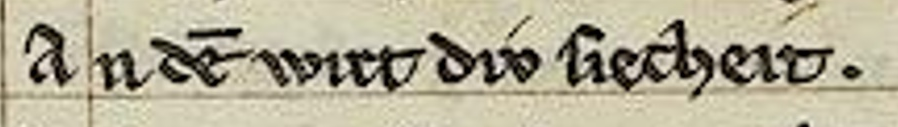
An de(m) wirt div ſiecheit.
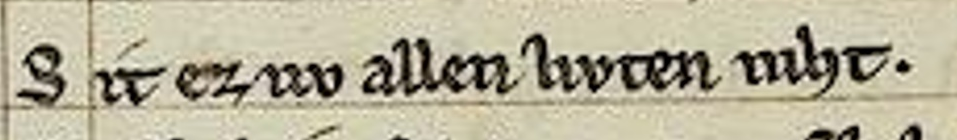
Sit ez nv allen livten niht.
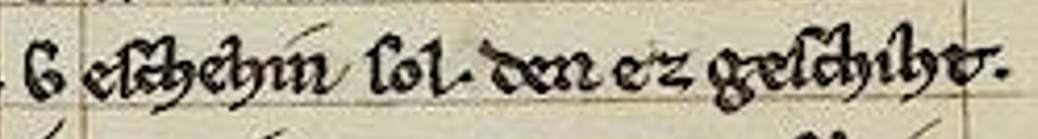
Geſchehin ſol den ez geſchiht.
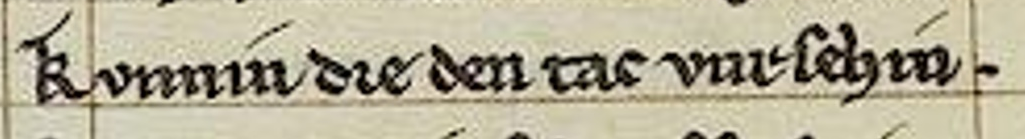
Kvnnin die den tac vurſehin.
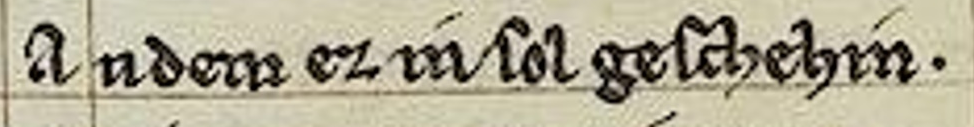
An dem ez in ſol geſchehin.
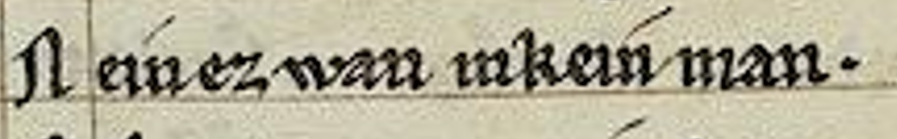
Nein ez wan inkein man.
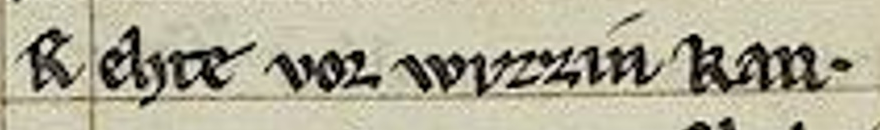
Rehte vor wizzin kan.
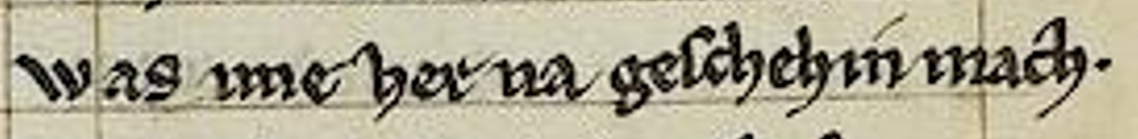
Was ime her na geſchehin mach.
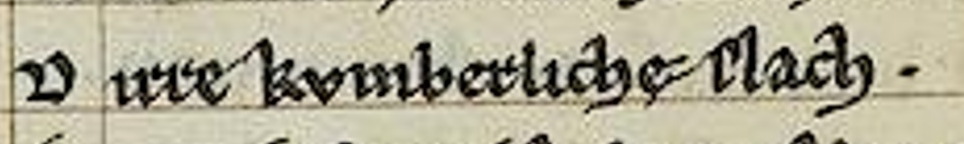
Dirre kvmberliche ſlach.
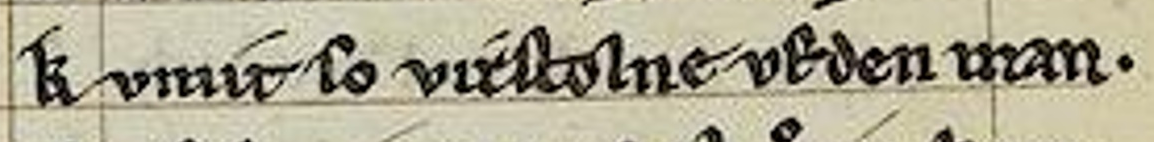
Kvmit ſo virſtolne vf den man.
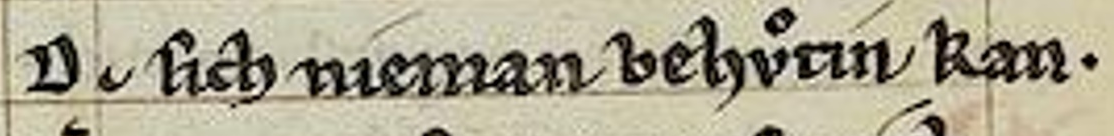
D(az) ſich nieman behv°otin kan.
